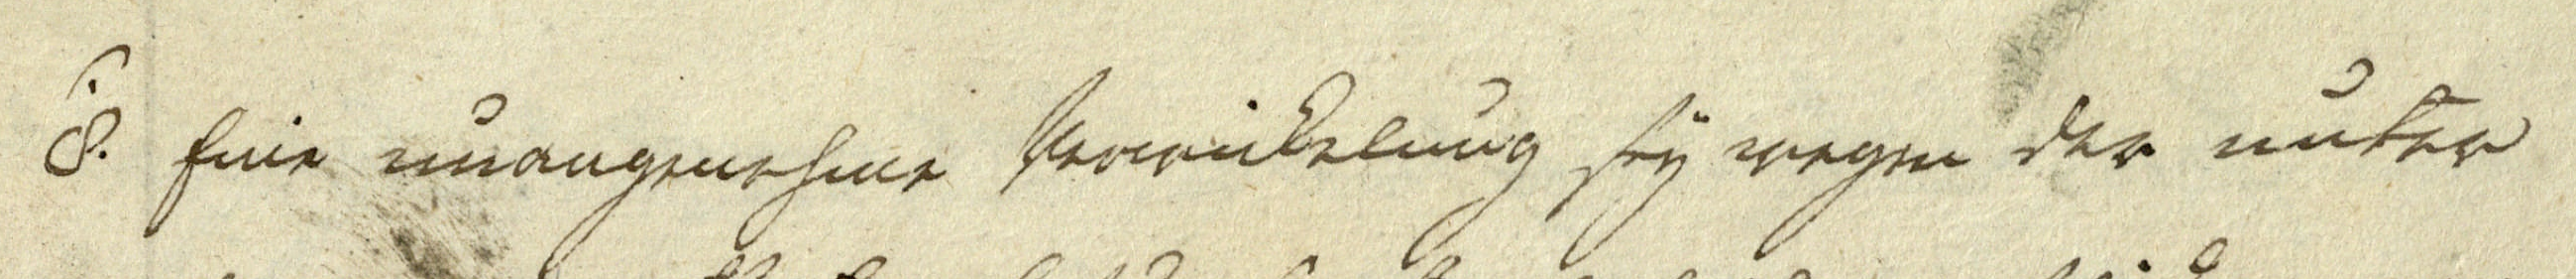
8.Eine unangenehme Verwickelung seÿ wegen der unter
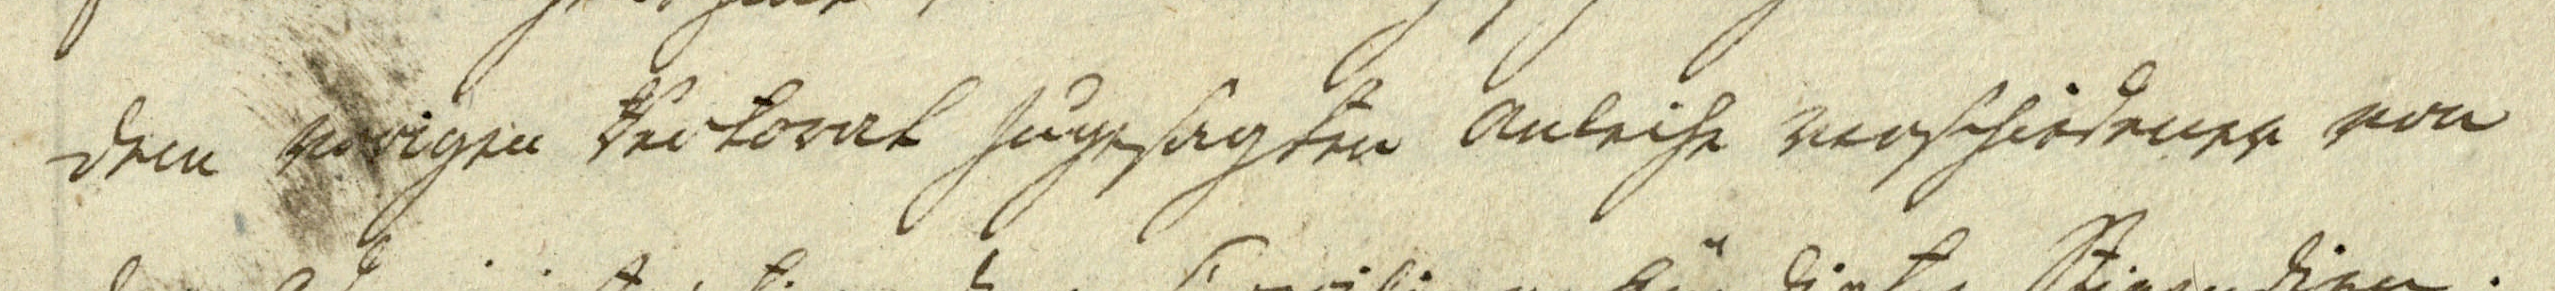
dem vorigen Rectorat zugesagten Anleihe verschiedener von
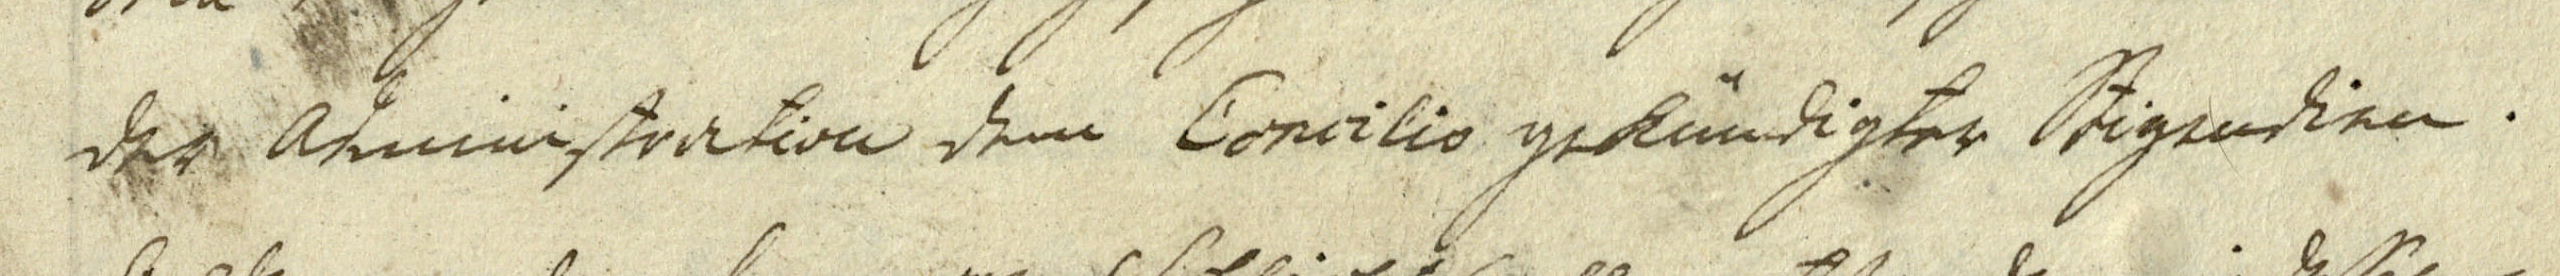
der Administration dem Concilio gekündigter Stipendien¬
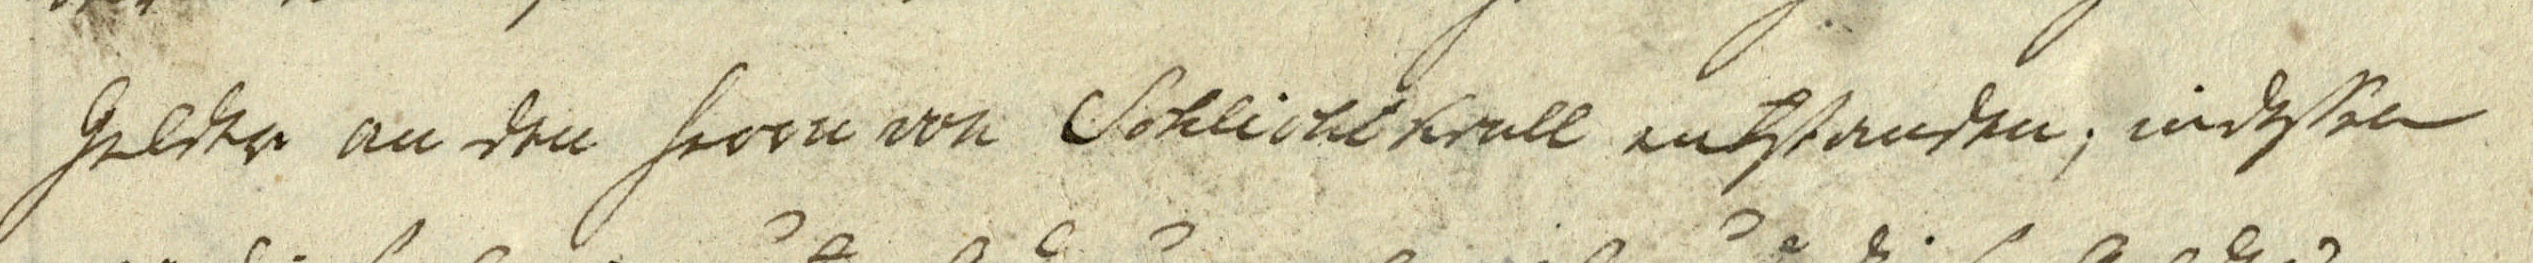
Gelder an den Herrn von Schlichtkrull entstanden; indessen
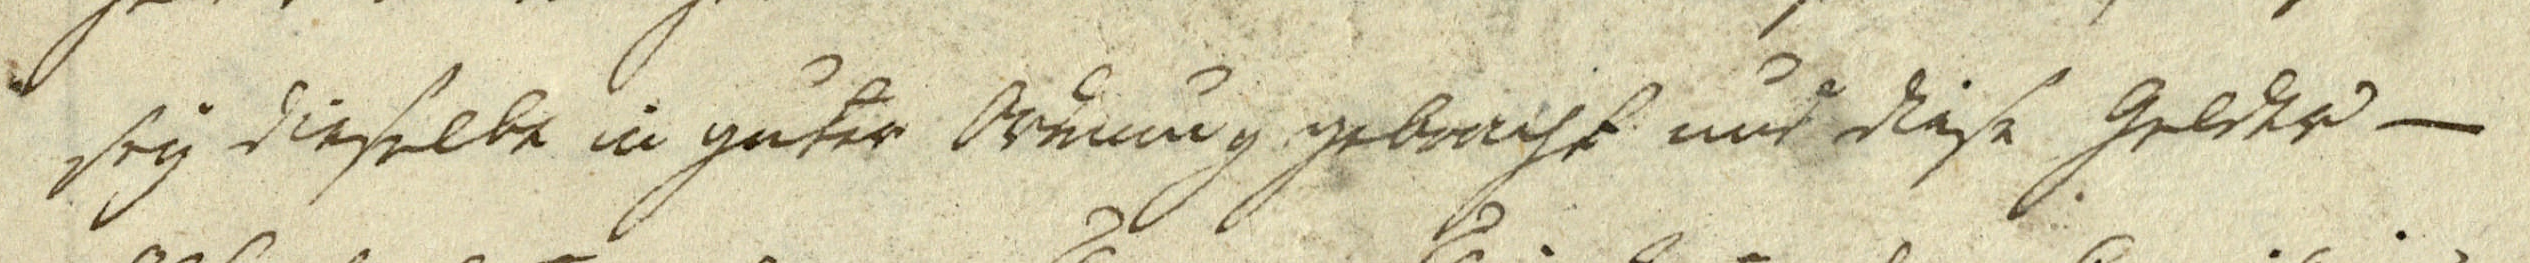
seÿ dieselbe in guter Ordnung gebracht und diese Gelder -
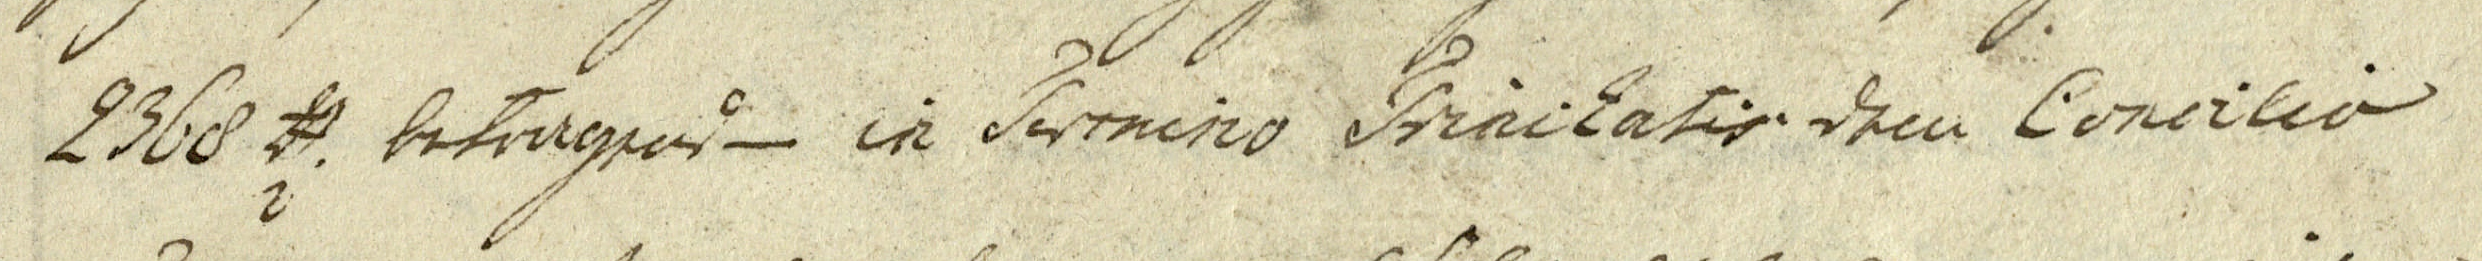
2368 Rt. betragend - in Termino Trinitatis dem Concilio
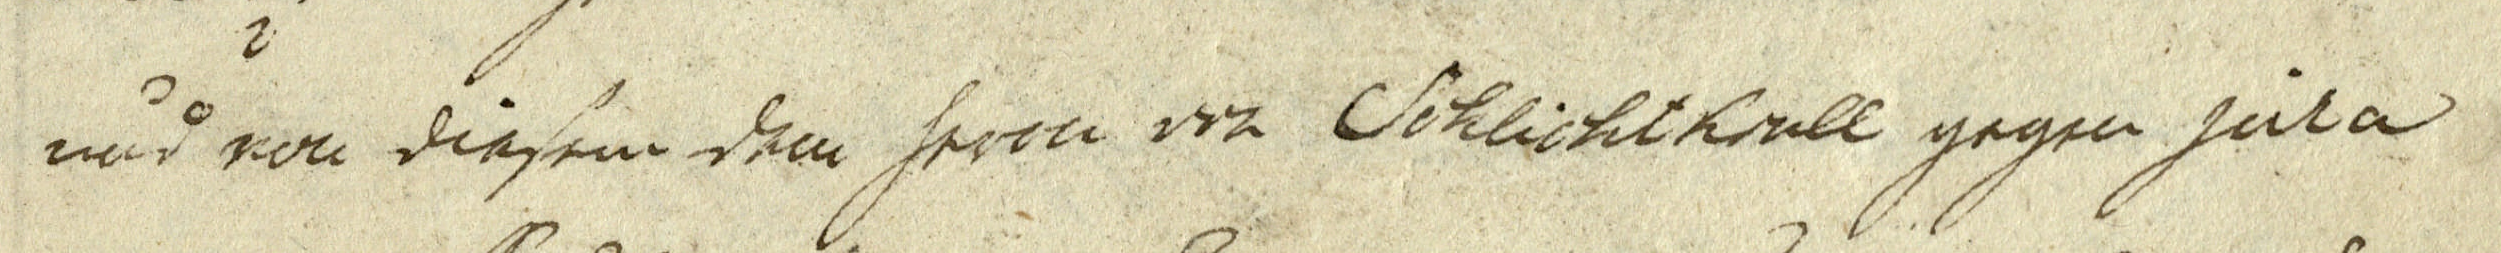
und von diesem dem Herrn von Schlichtkrull gegen jura
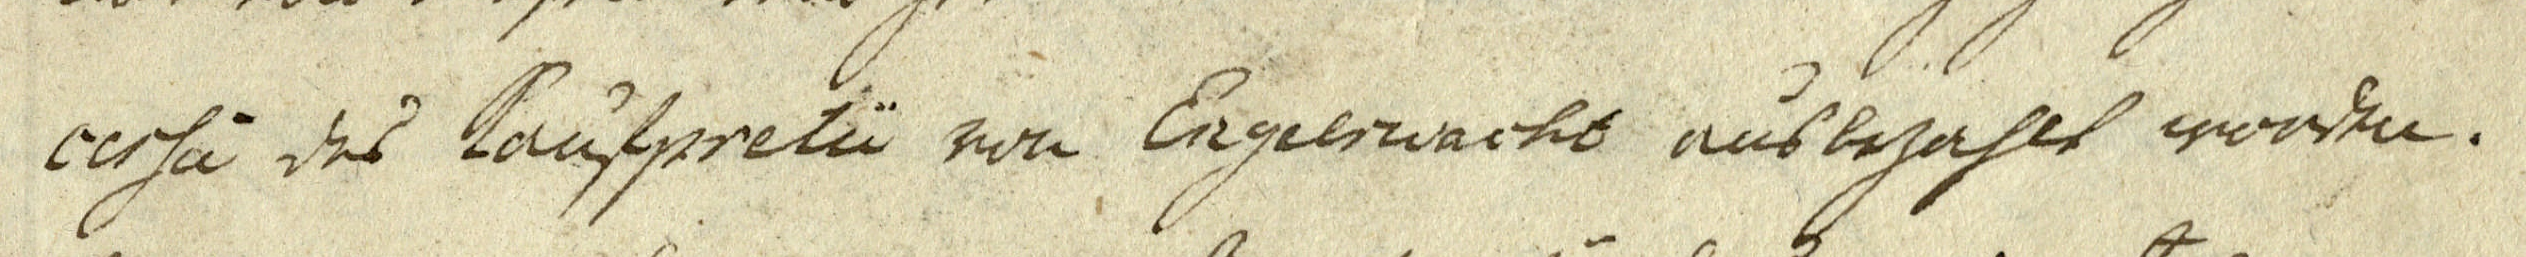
cessa des Kaufpretii von Engelbrecht ausbezahlt worden.
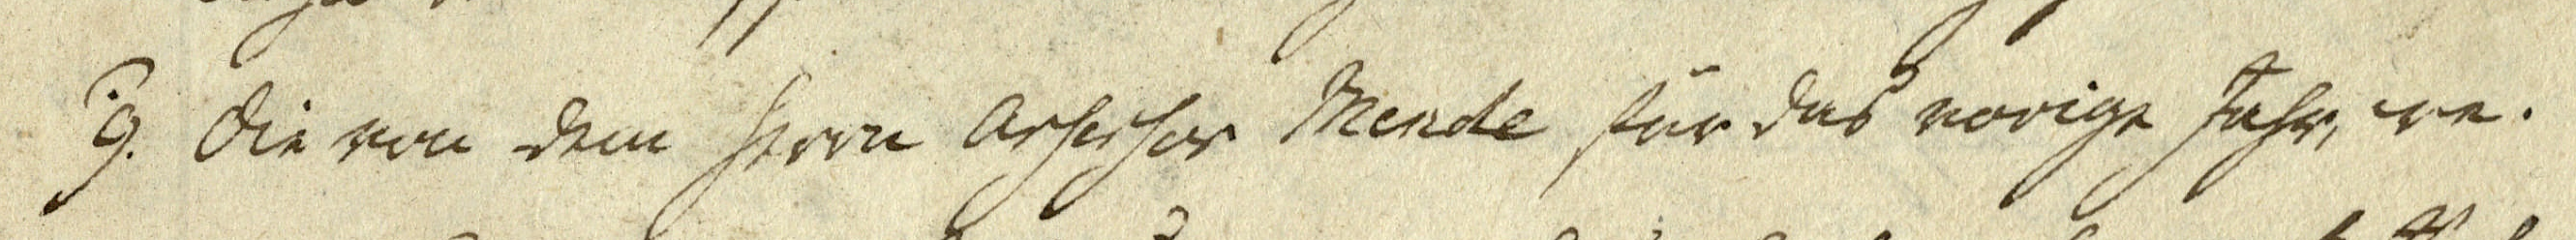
9. Die von dem Herrn Assessor Mende für das vorige Jahr, we¬
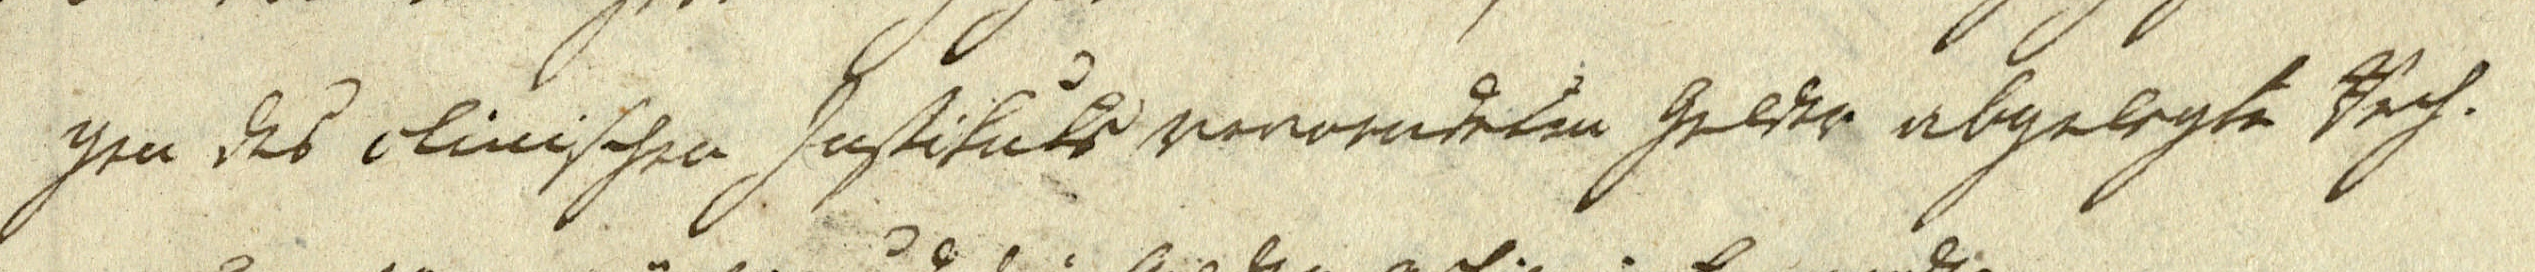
gen des clinischen Instituts verwendeten Gelder abgelegte Rech¬
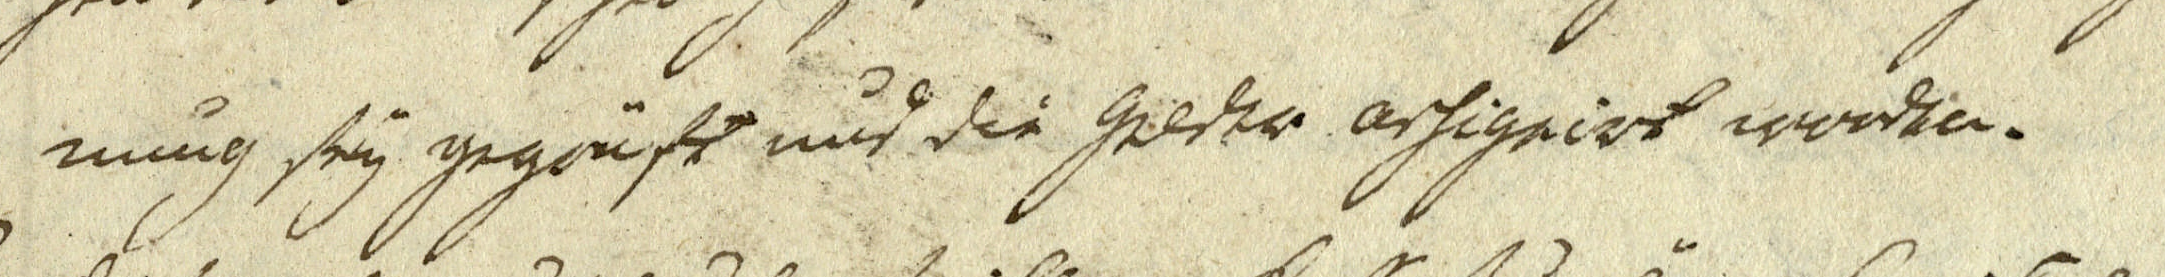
nung seÿ geprüft und die Gelder assignirt worden.
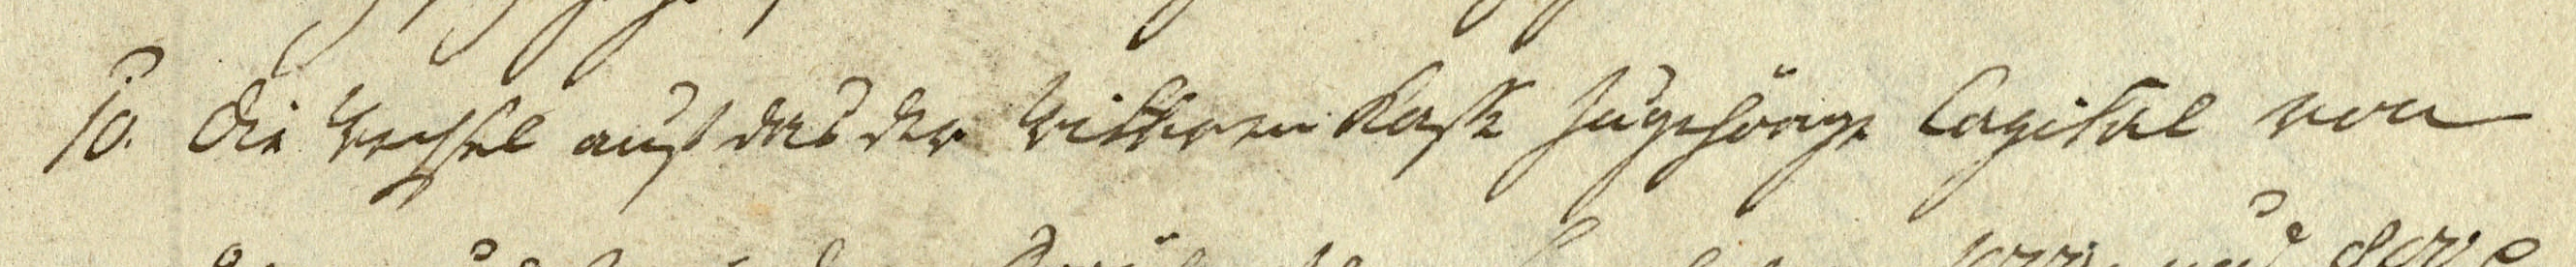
10. Die Wechsl auf das der Wittwenkasse zugehörige Capital von
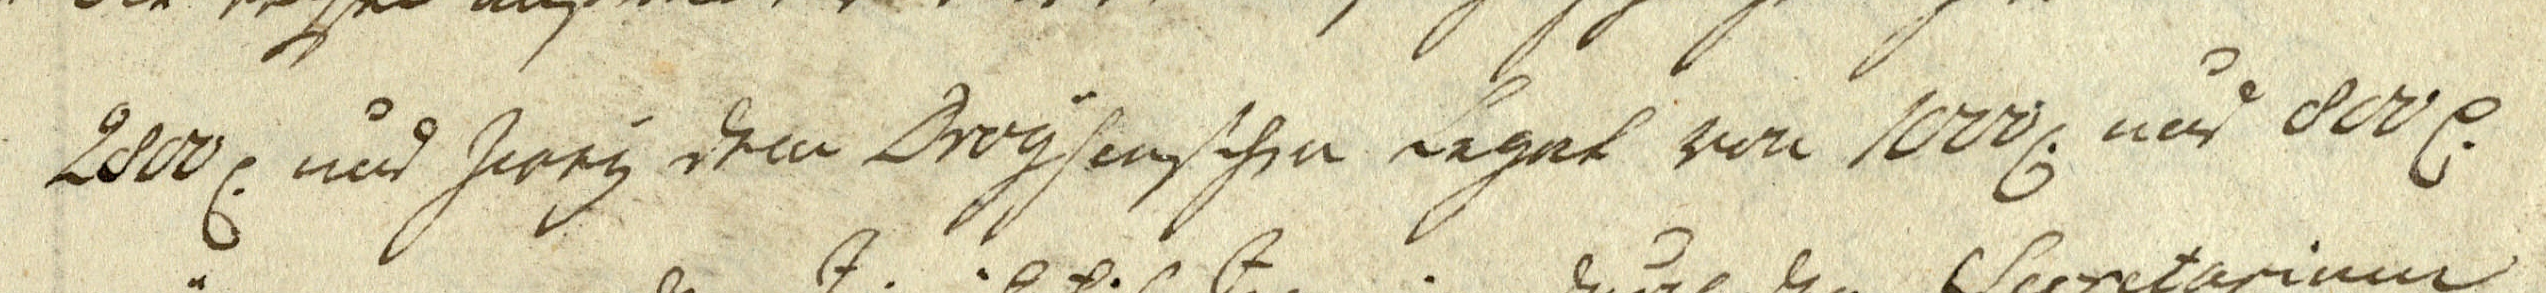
2800 l. und zweÿ dem Droÿsenschen Legat von 1000 l. und 800 l.
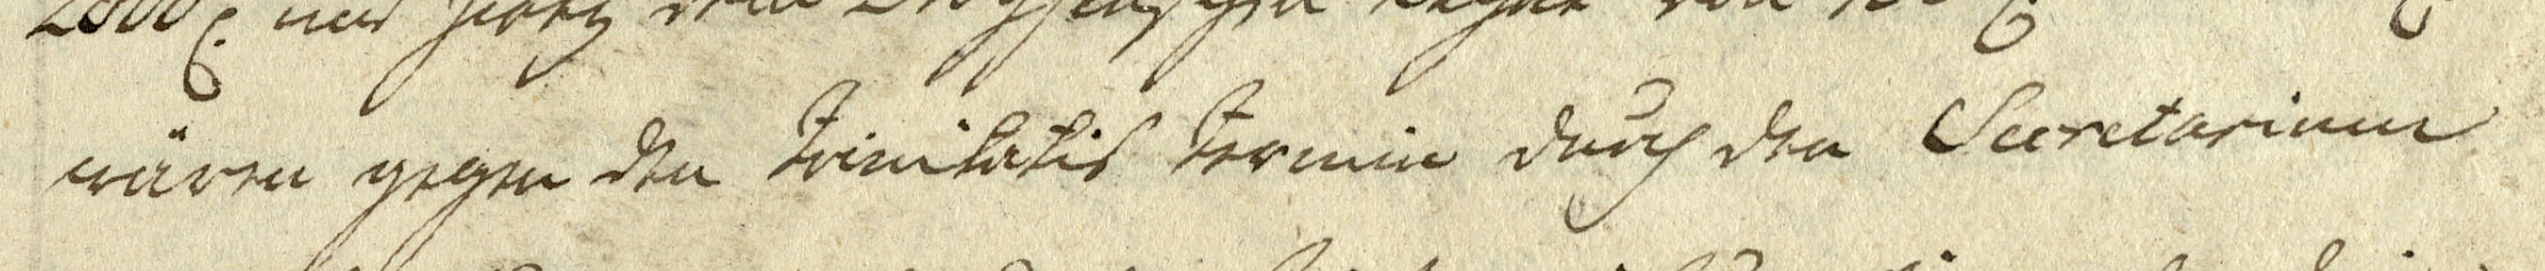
wären gegen den Trinitatis Termin durch den Secretarium
